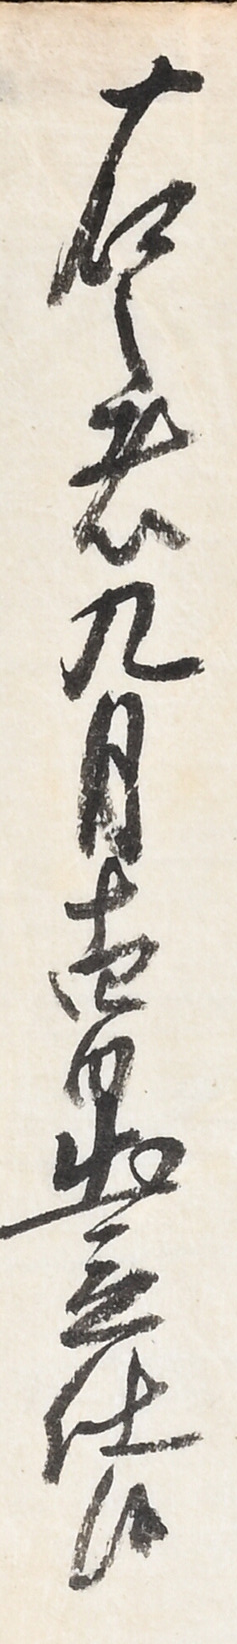右之者九月十四日出立仕候
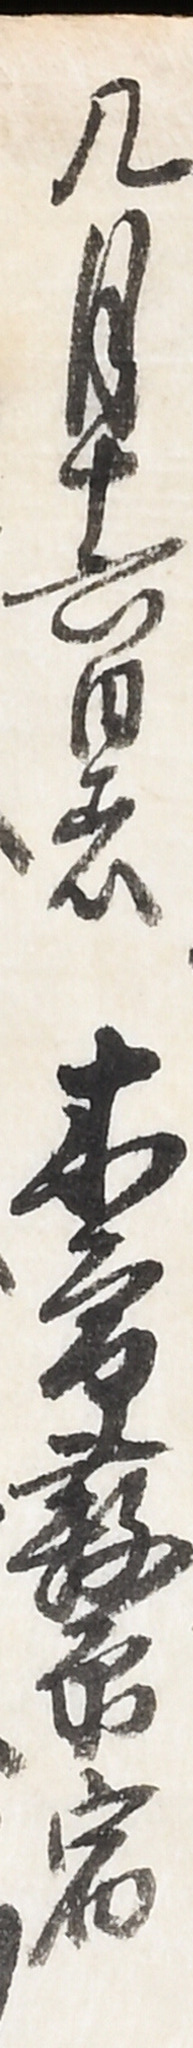八月十六日着木曽藪原宿
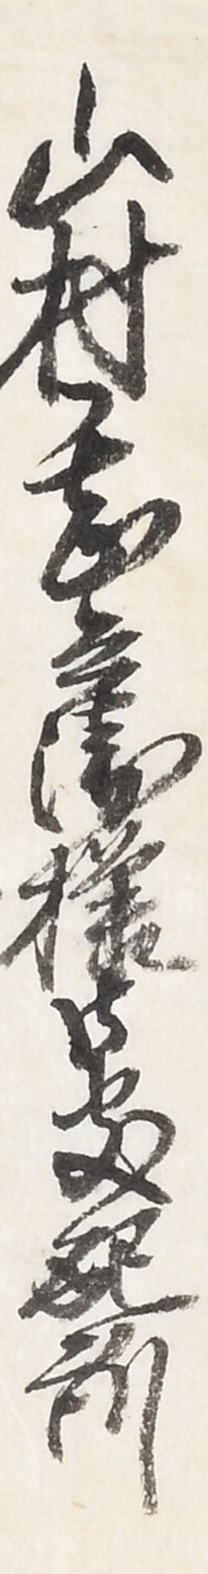山村甚兵衛様御支配所
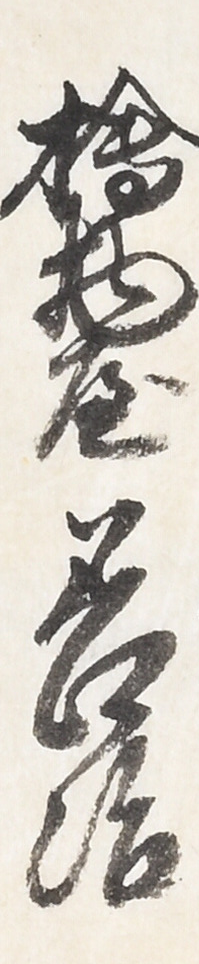檜物屋善治
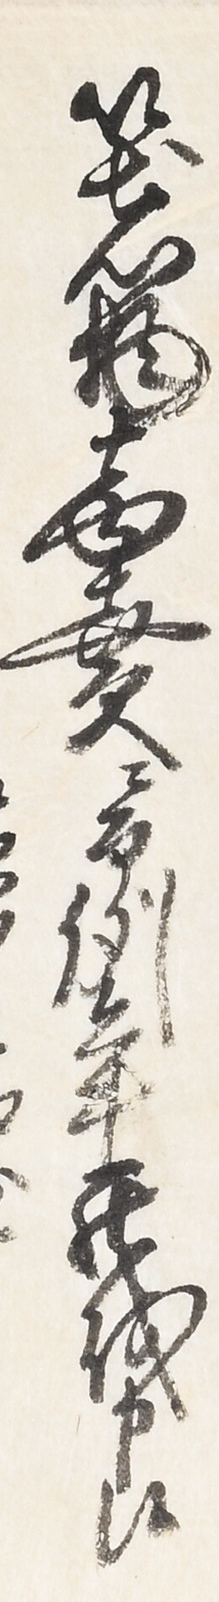箸物商売ニ而例年罷越申候
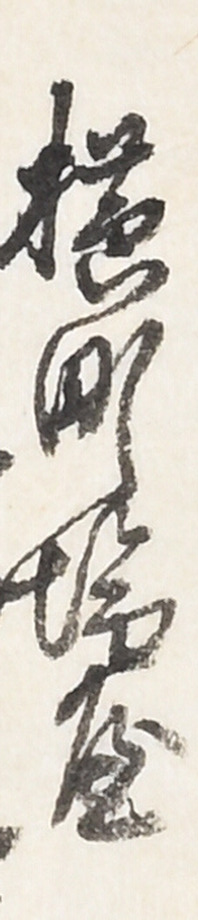横町塩屋
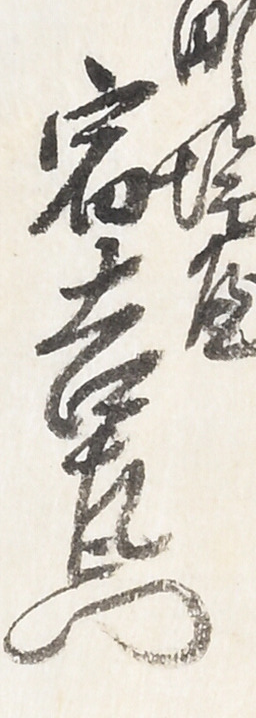宿吉左衛門
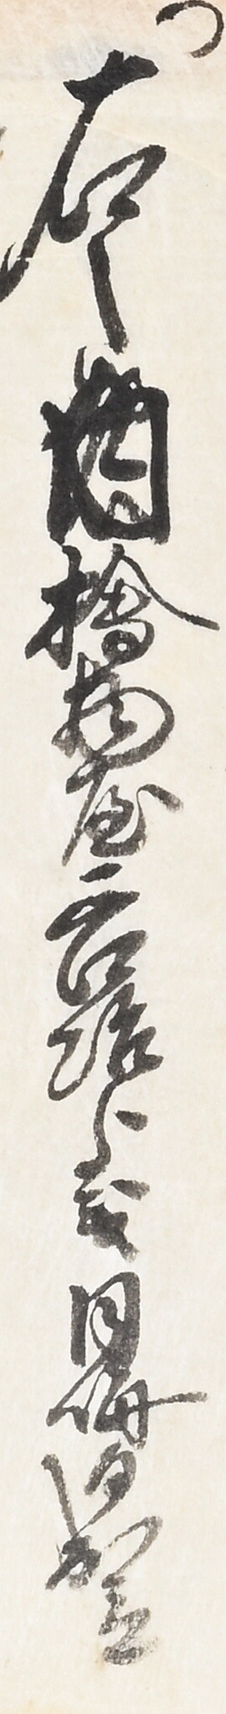〇右之内檜物屋善治郎義同晦日出立
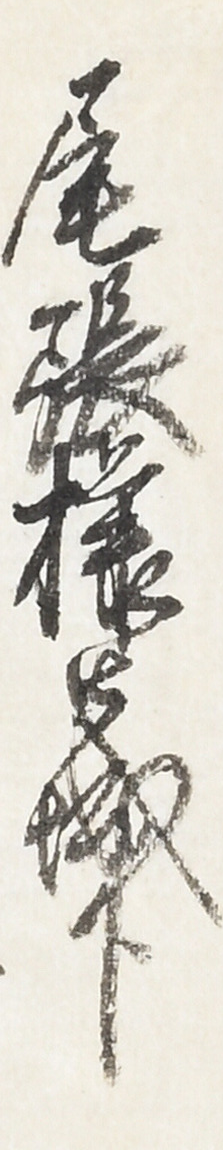尾張様御城下
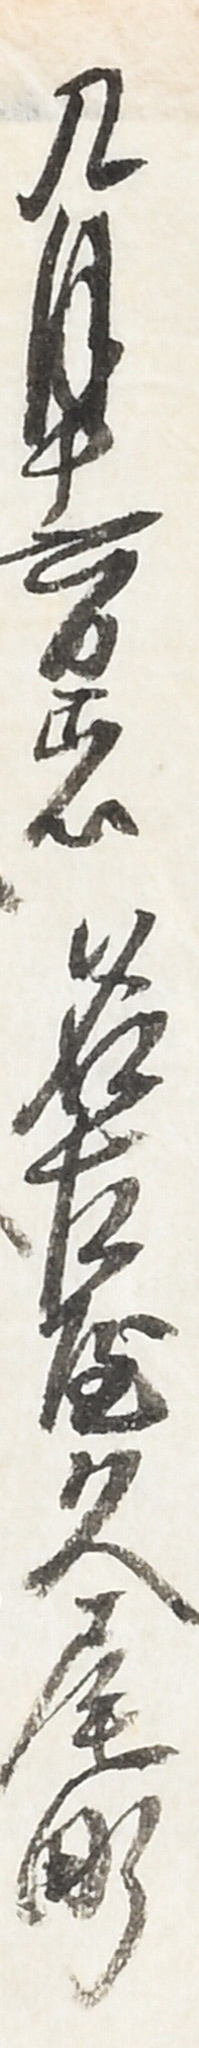八月十六日着名古屋久尾町
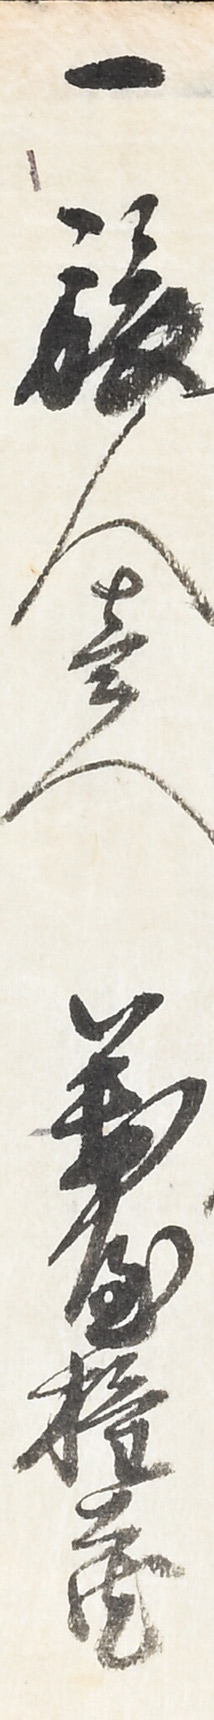一旅人壱人万屋権蔵
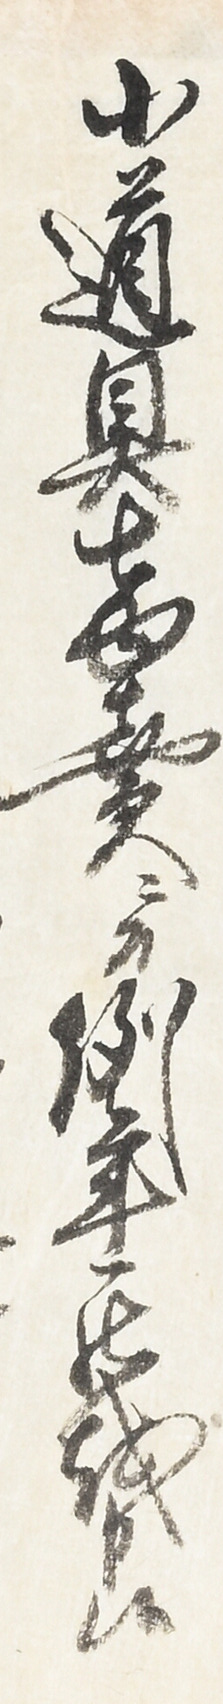小道具商売ニ而例年罷越申候
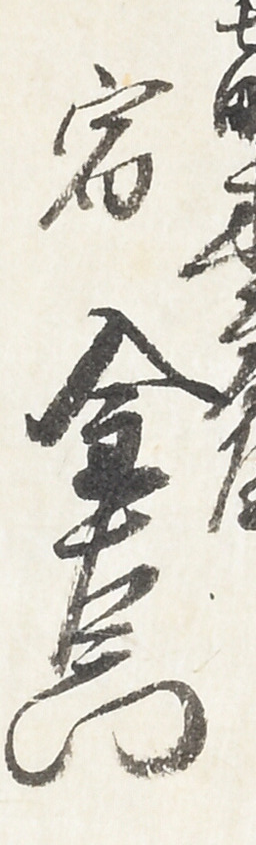宿金右衛門

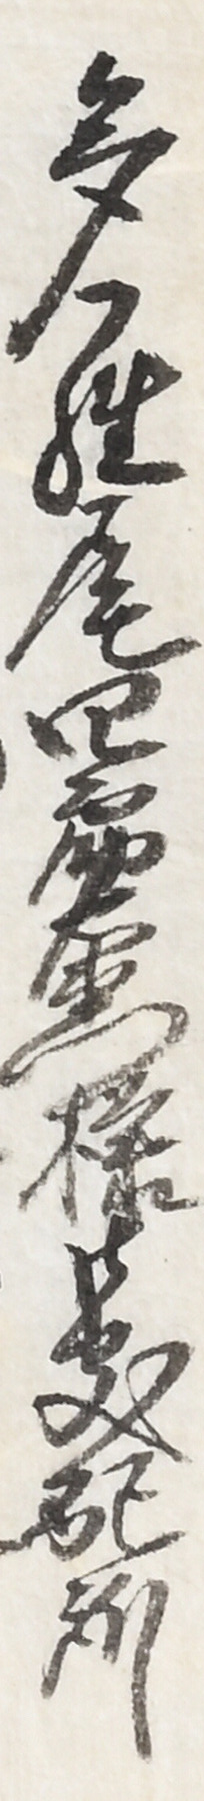多羅尾四郎右衛門様御支配所
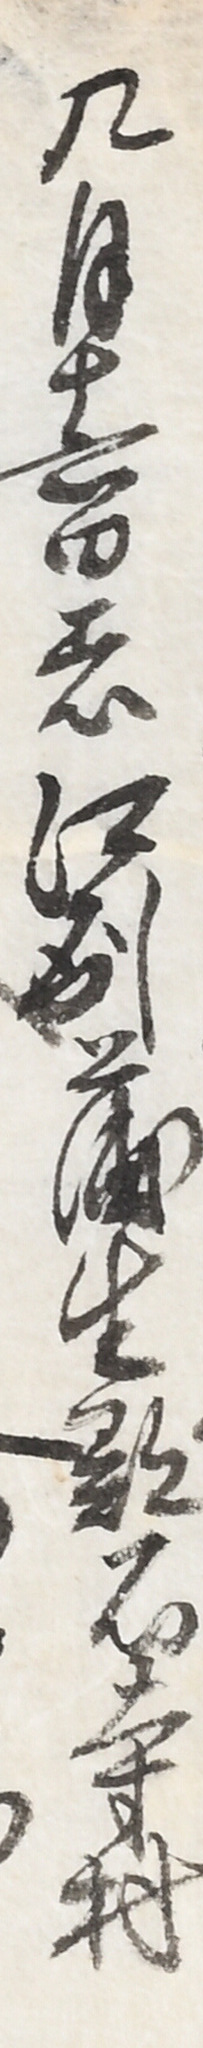八月十六日着江州蒲生郡石寺村
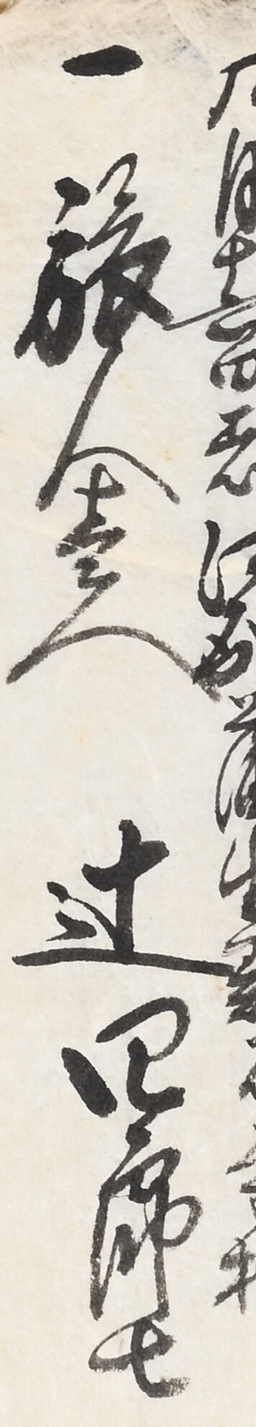一旅人壱人辻四郎七
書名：旅人泊控帳
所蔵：伊那市立高遠町図書館・合同会社AMANE
